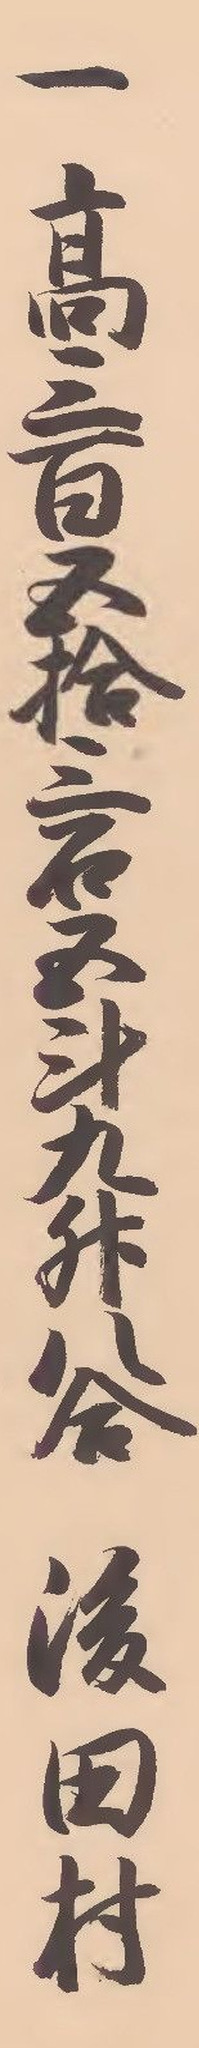一高三百五拾三石五斗九升八合後田村

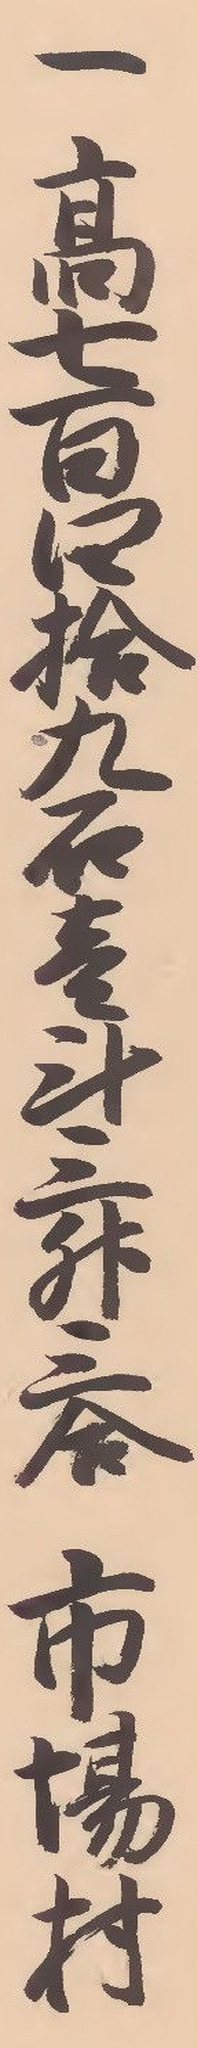一高七百四拾九石壱斗三升三合市場村
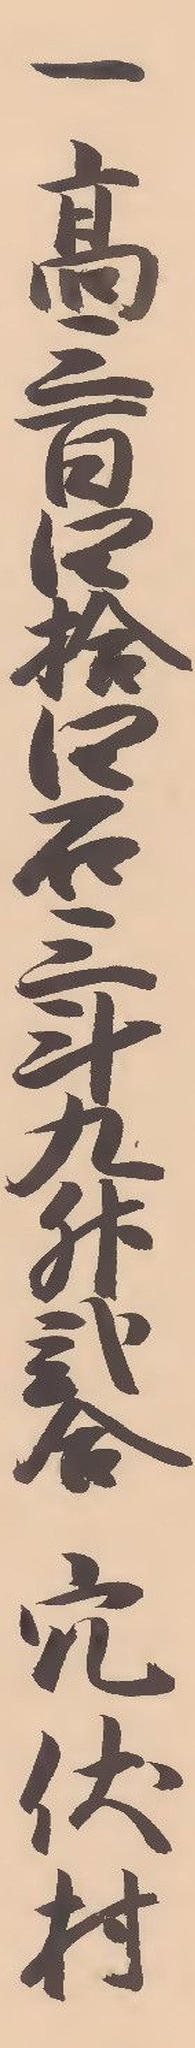一高三百四拾四石三斗九升弐合穴伏村
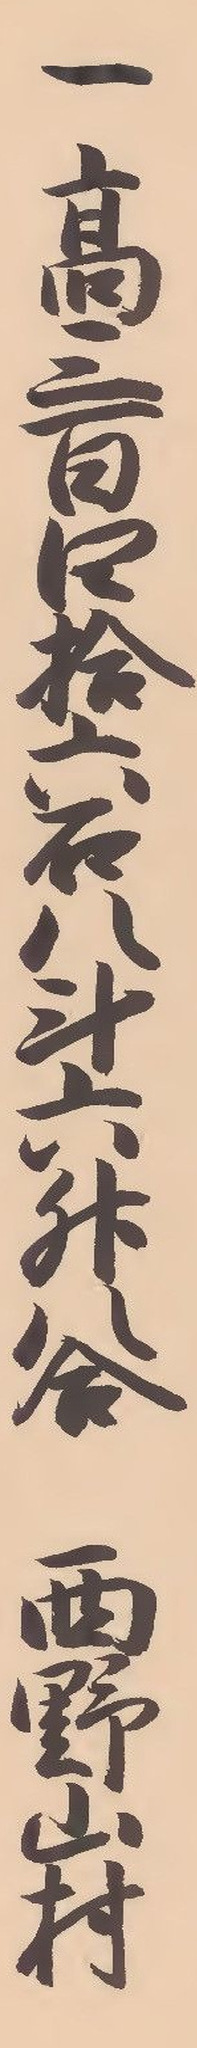一高三百四拾六石八斗六升八合西野山村
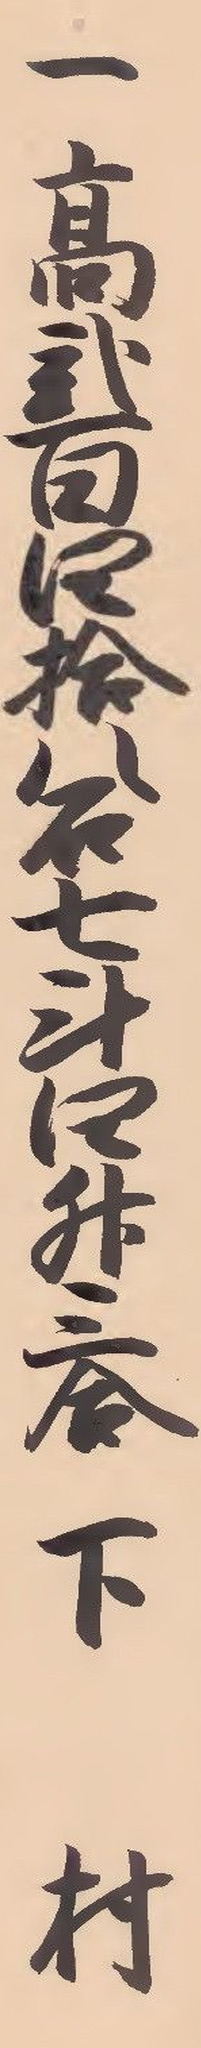一高弐百四拾八石七斗四升三合下村
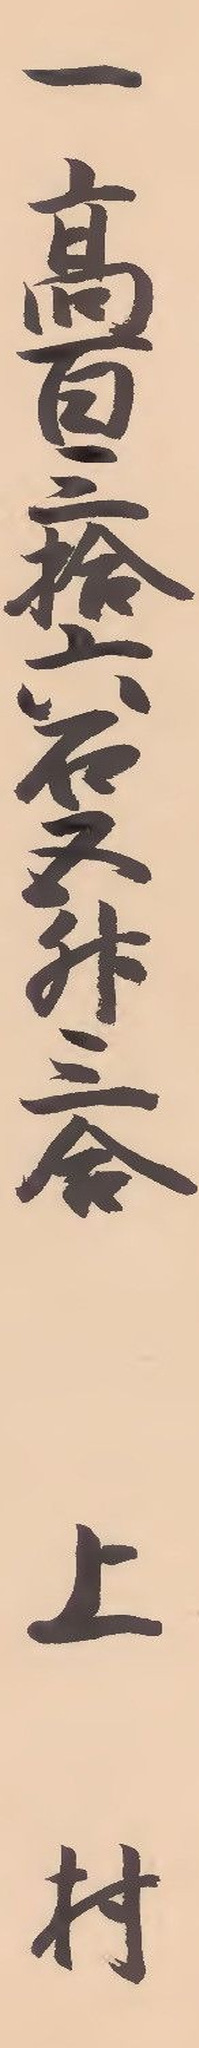一高百三拾六石五升三合上村
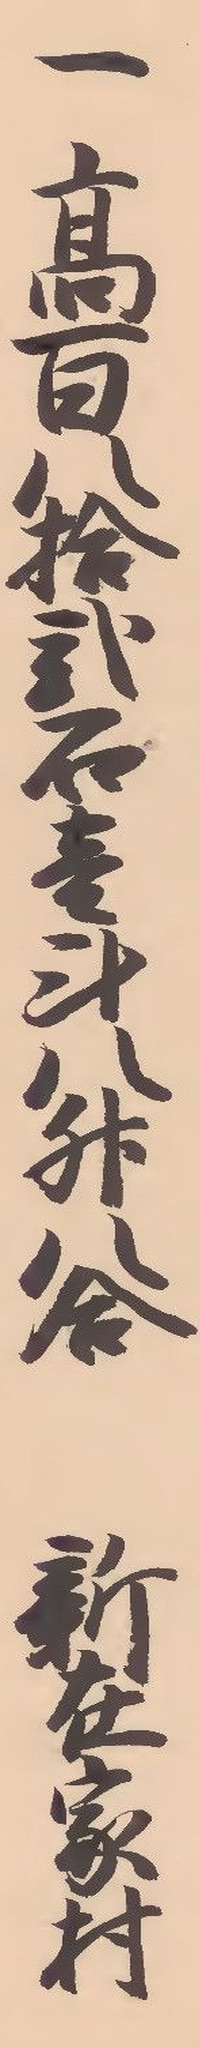一高百八拾弐石壱斗八升八合新在家村

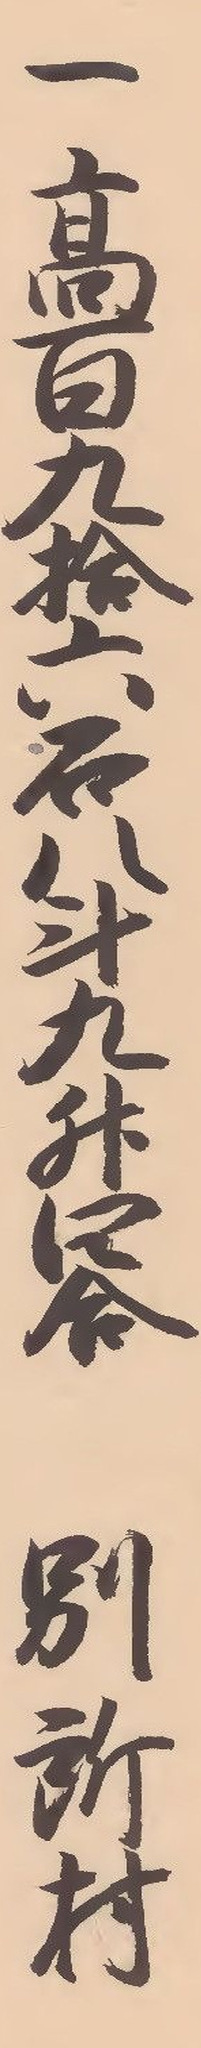一高百九拾六石八斗九升四合別所村
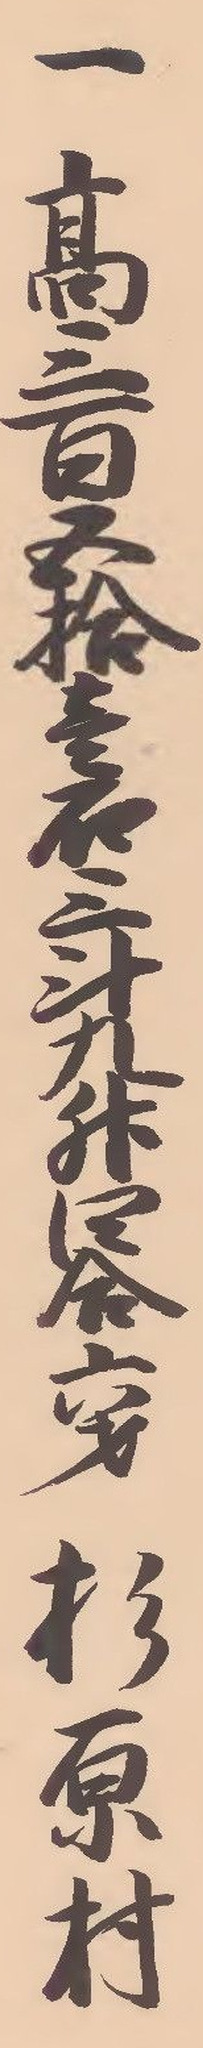一高三百五拾壱石三斗九升四合六才杉原村

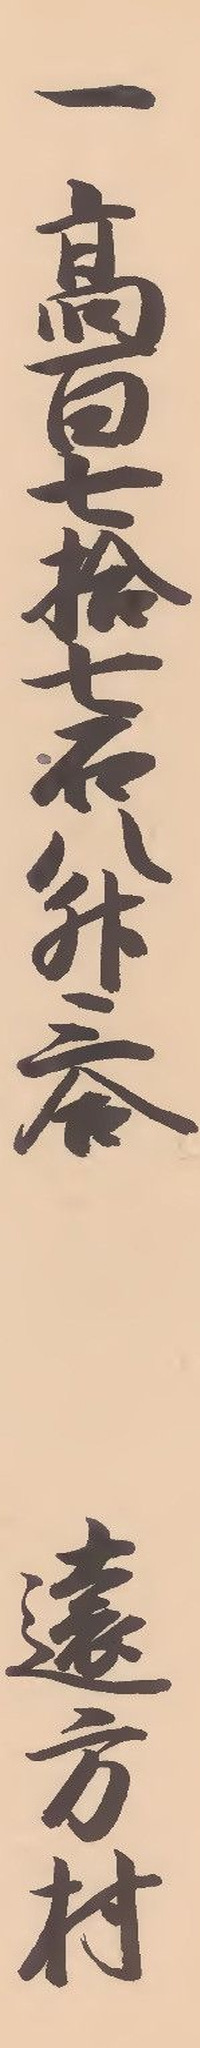一高百七拾七石八升三合遠方村
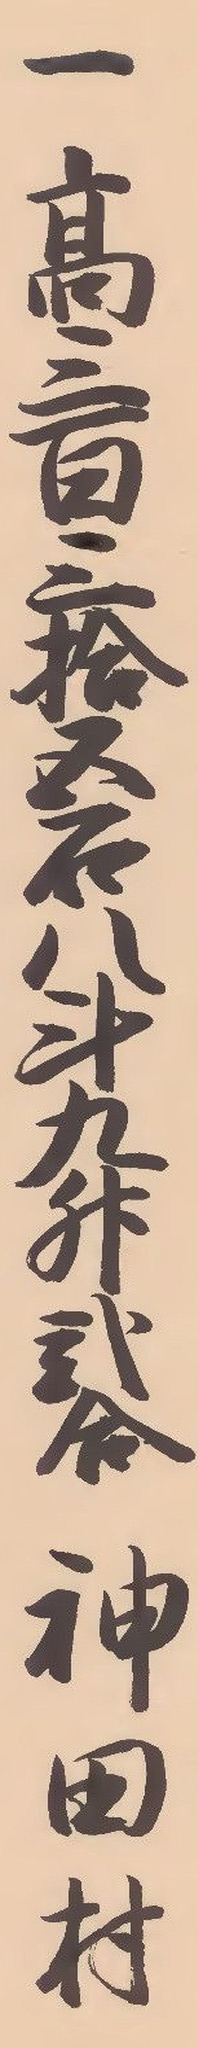一高三百三拾五石八斗九升弐合神田村
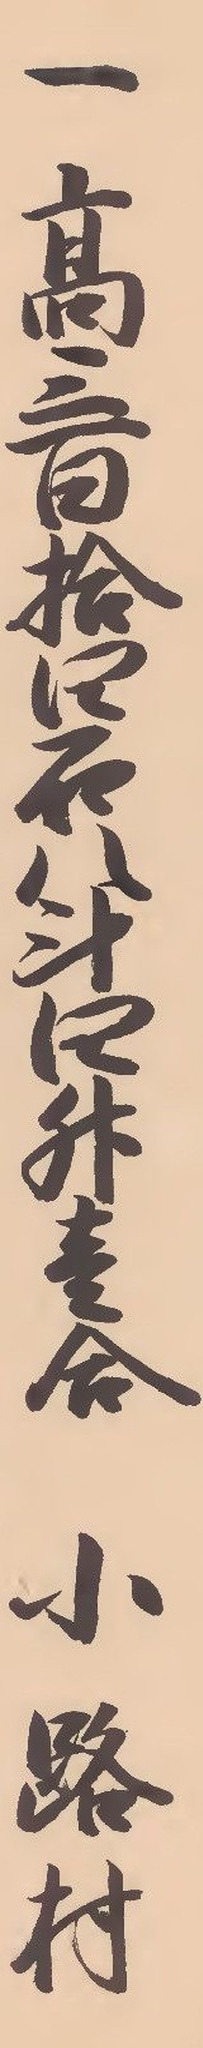一高三百拾四石八斗四升壱合小路村

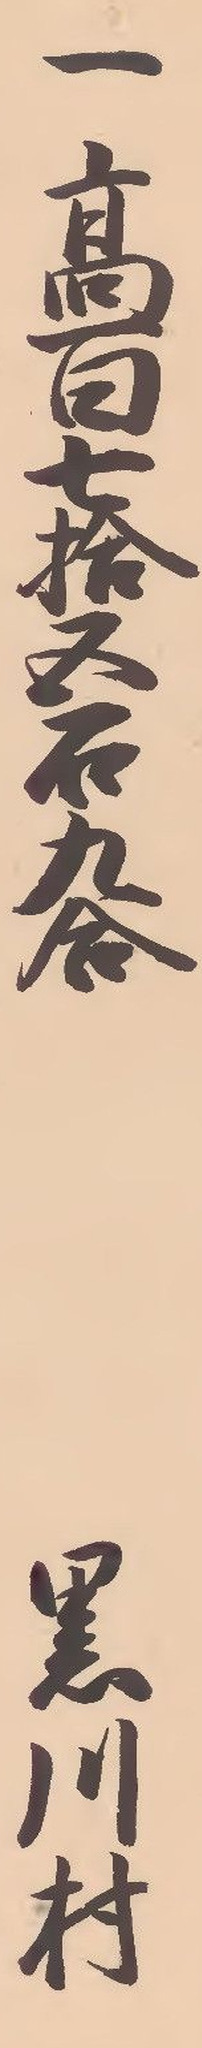一高百七拾五石九合黒川村
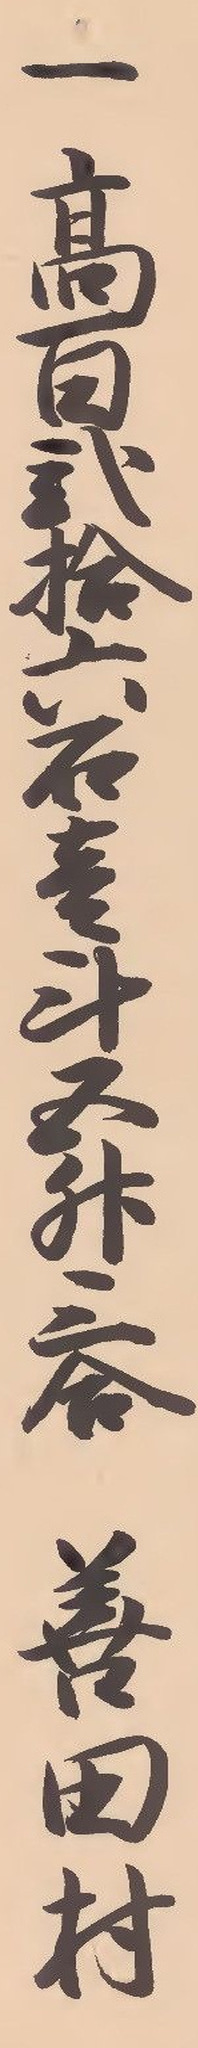一高百弐拾六石壱斗五升三合善田村
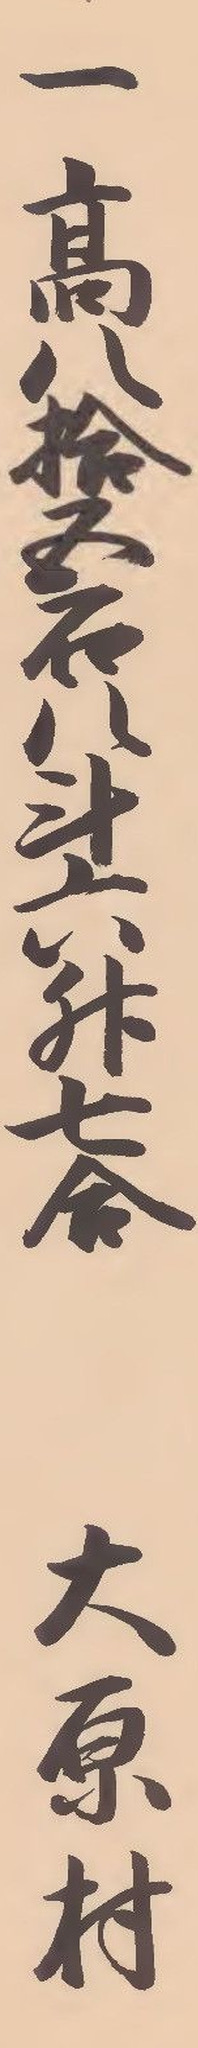一高八拾五石八斗六升七合大原村
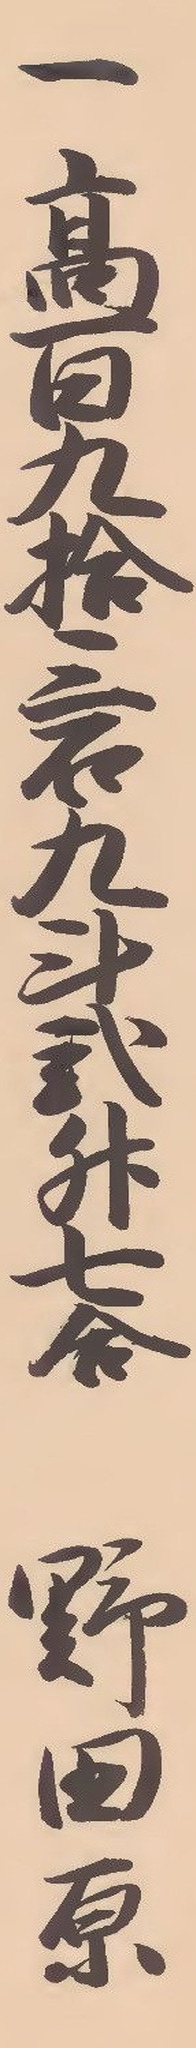一高百九拾三石九斗弐升七合野田原
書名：紀伊国郷帳
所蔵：国立公文書館 National Archives of Japan
